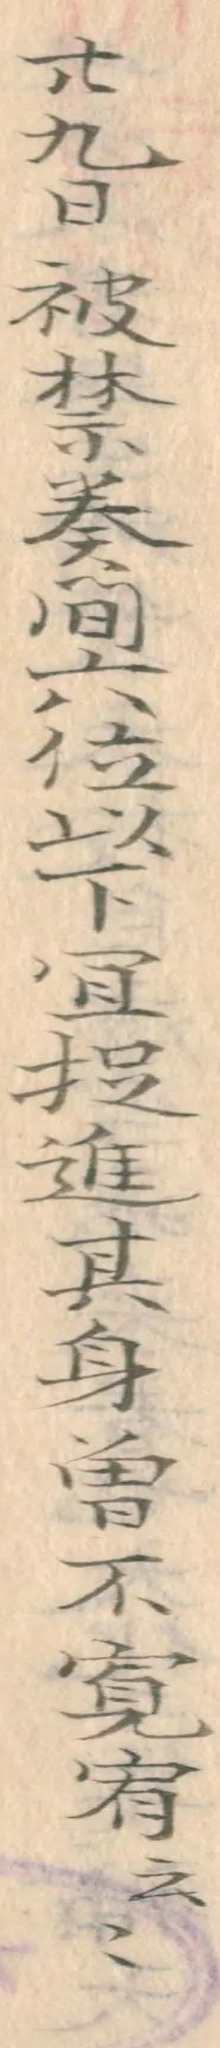廿九日被禁奏間六位以下宜捉進其身曽不寛宥云々
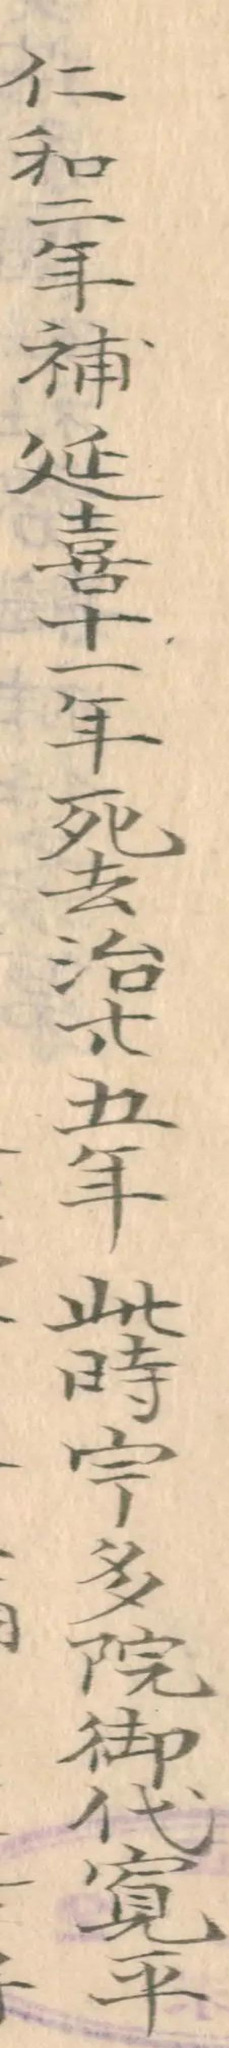貞基仁和二年補延喜十一年死去治廿五年此時宇多院御代寛平
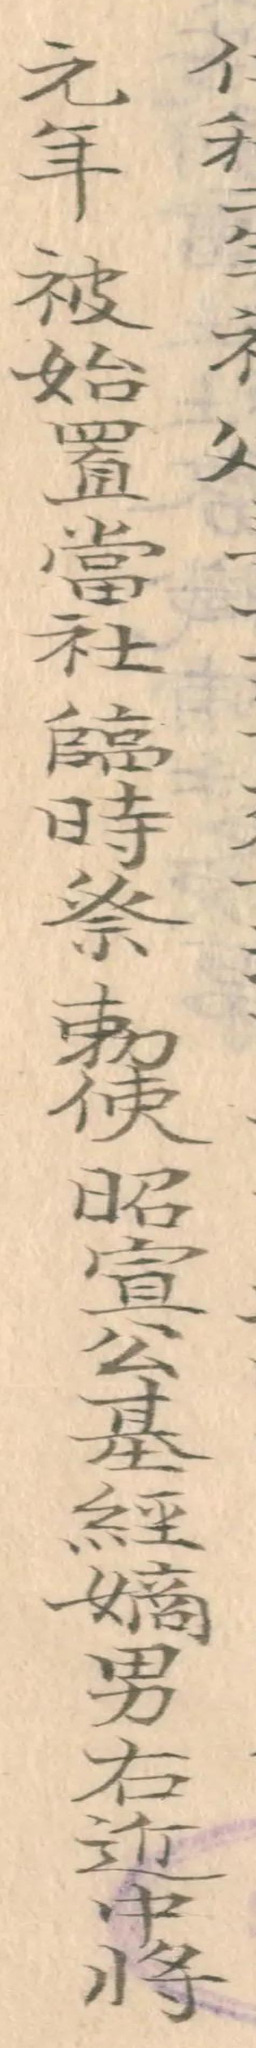元年被始置当社臨時祭勅使昭宣公基経嫡男右近中将
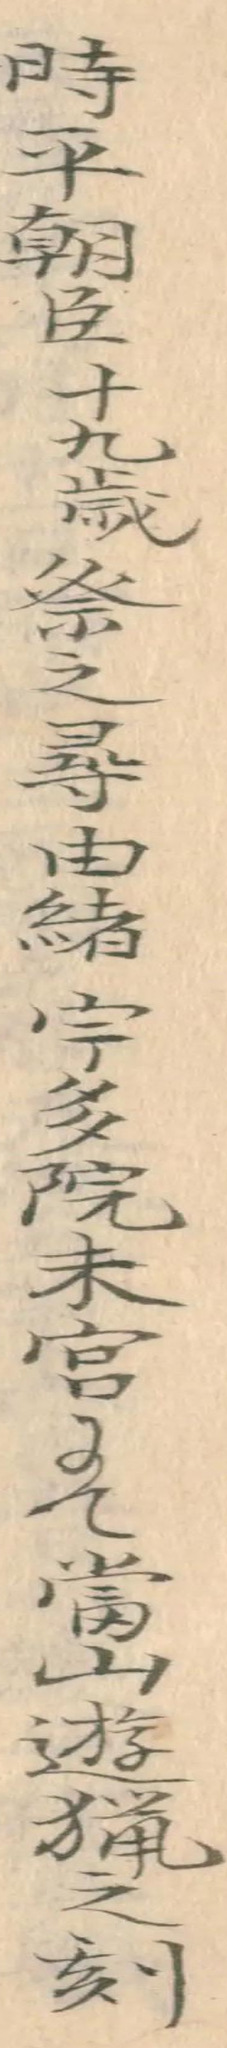時平朝臣十九歳祭之尋由緒宇多院未宮にて当山遊猟之刻
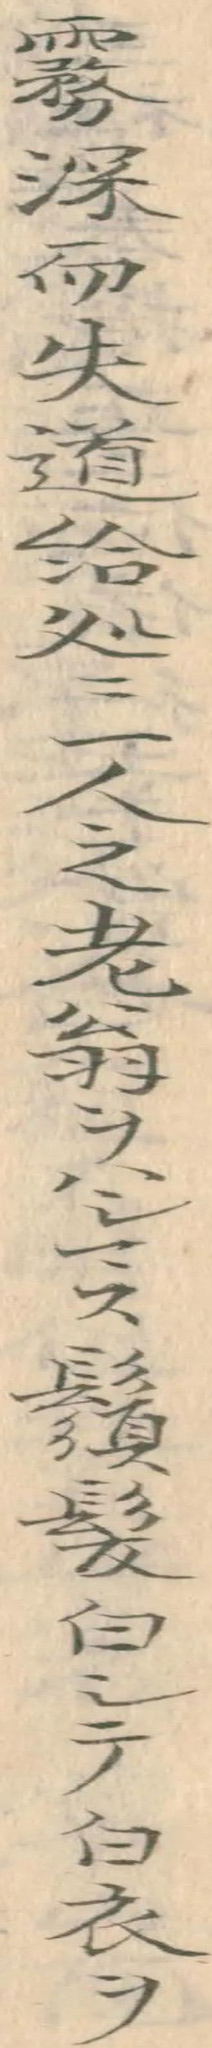霧深而失道給処ニ一人之老翁ヲハシマス鬚髪白シテ白衣ヲ
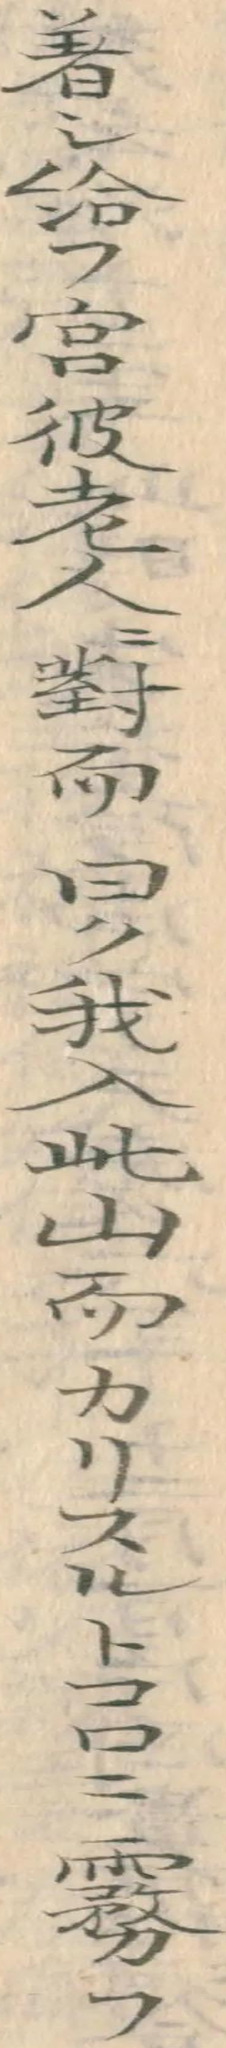着シ給フ宮彼老人ニ対而曰ク我入此山而カリスルトコロニ霧フ
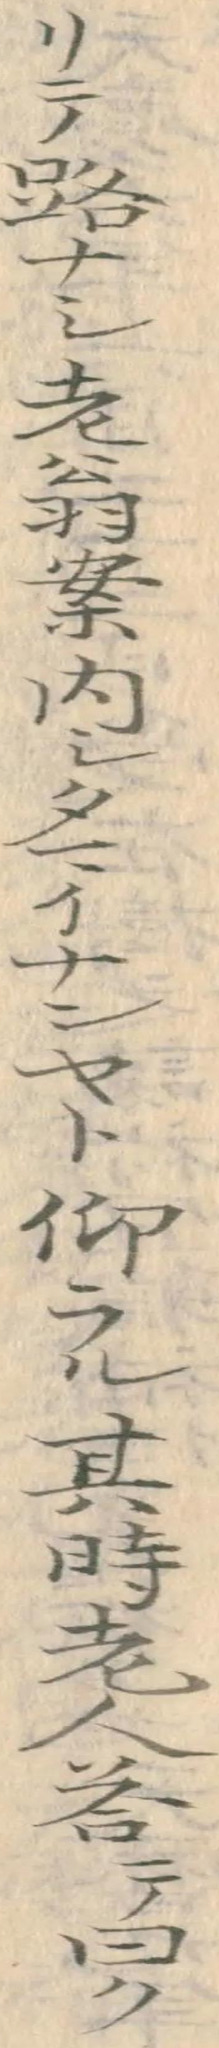リテ路ナシ老翁案内シタマイナンヤト仰ラル其時老人答テ曰ク
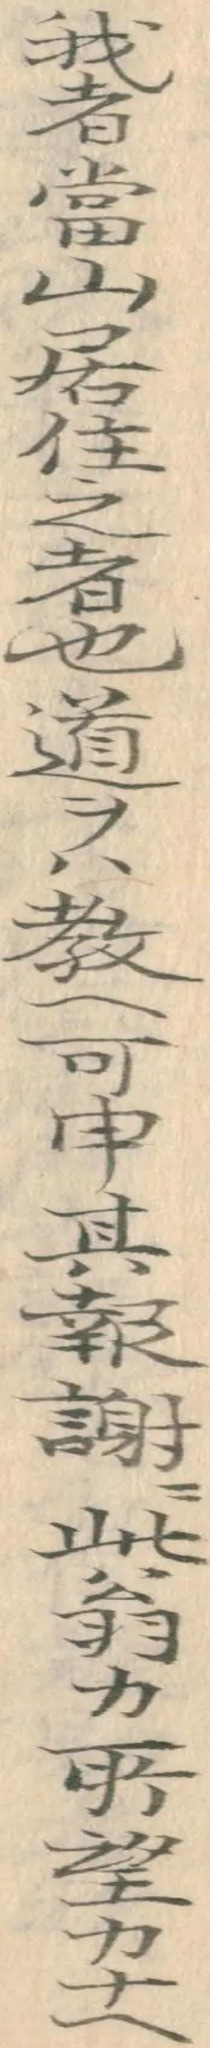我者当山居住之者也道ヲハ教ヘ可申其報謝ニ此翁カ所望カナヘ
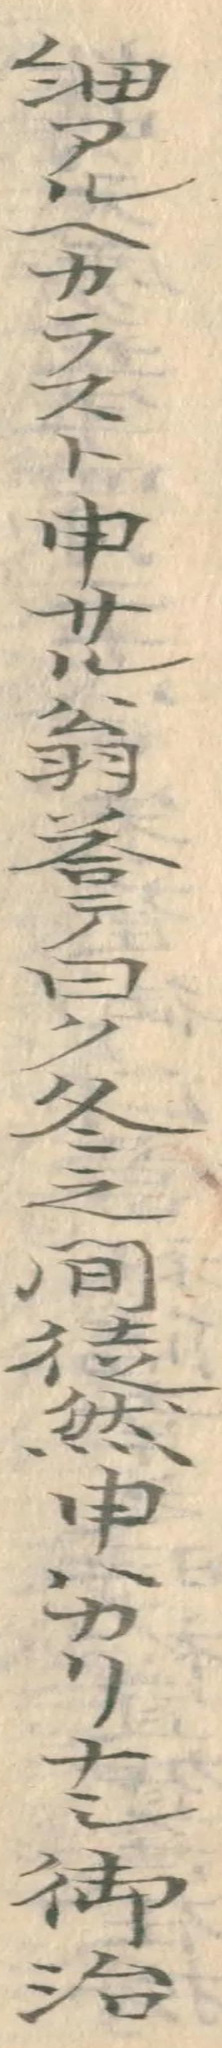細アルヘカラスト申サル翁答テ曰ク冬之間徒然申ハカリナシ御治
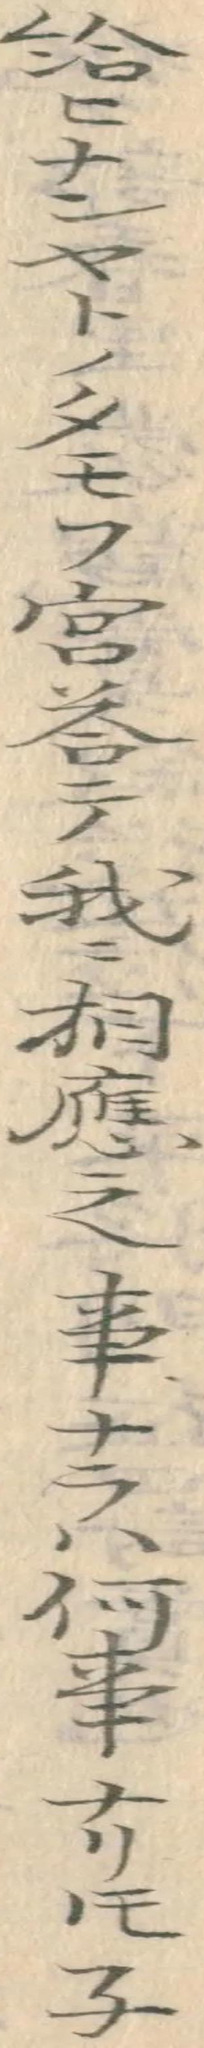給ヒナンヤトノタモフ宮答テ我ニ相応之事ナラハ何事ナリトモ子
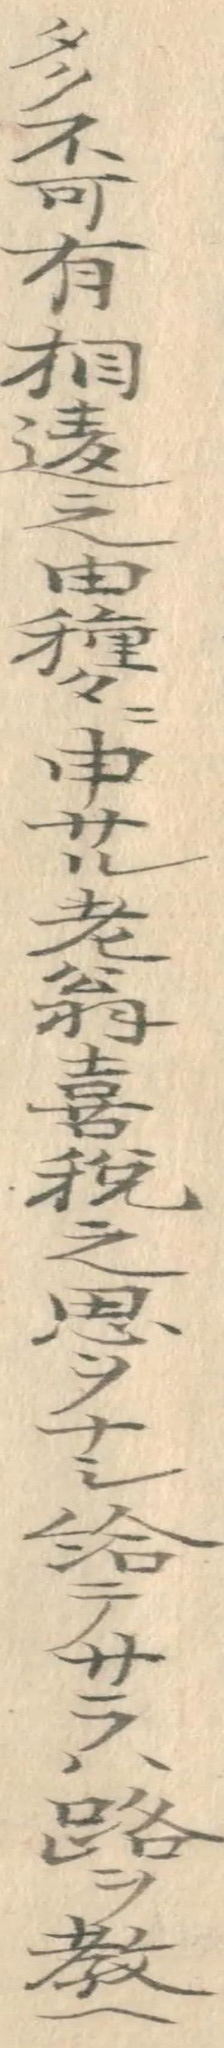多不可有相違之由種々ニ申サル老翁喜税之思ヲナシ給テサラハ路ヲ教ヘ
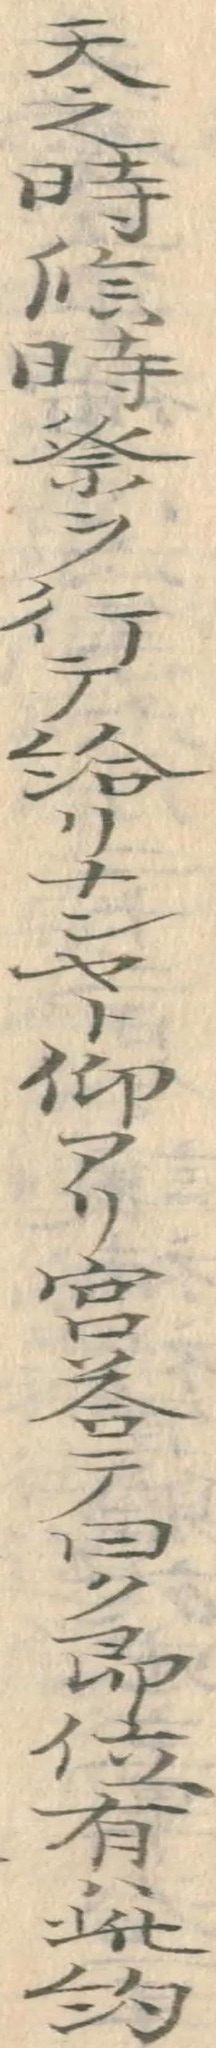天之時臨時祭ヲ行テ給リナンヤト仰アリ宮答テ曰ク即位有ハ此約
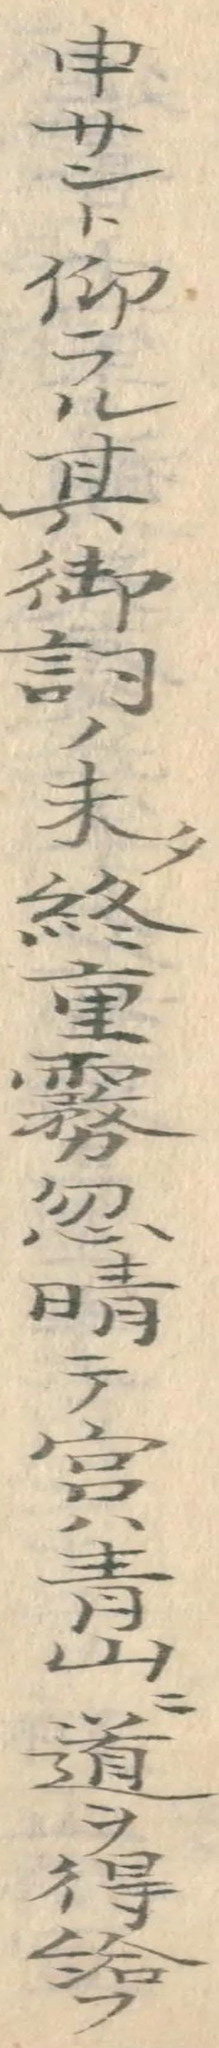申サント仰ラル其御詞ノ未タ終重霧忽晴テ宮ハ青山ニ道ヲ得給フ
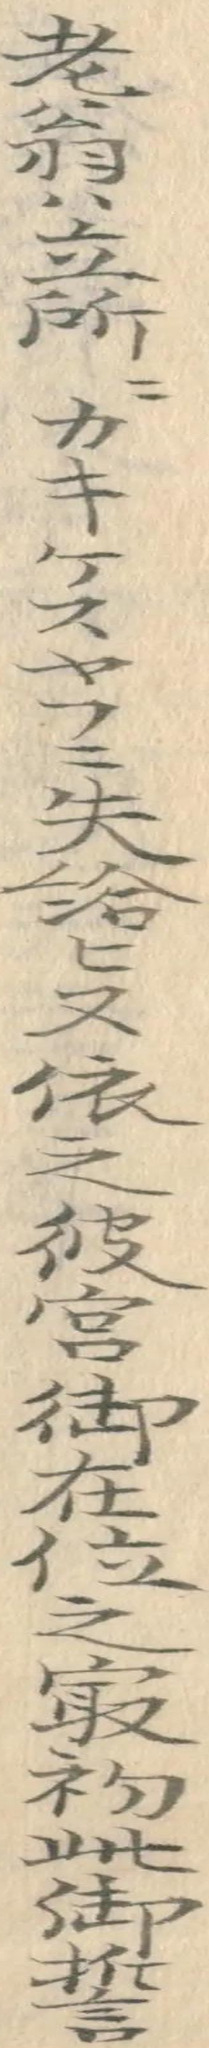老翁ハ立所ニカキケスヤフニ失給ヒ又依之彼宮御在位之最初此御誓
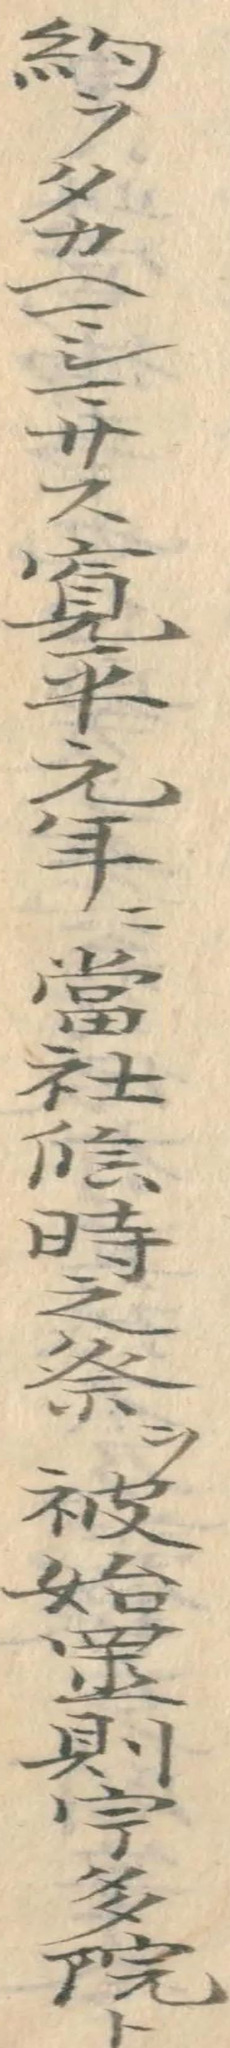約ヲタカヘマシマサス寛平元年ニ当社臨時之祭ヲ被始置則宇多院ト

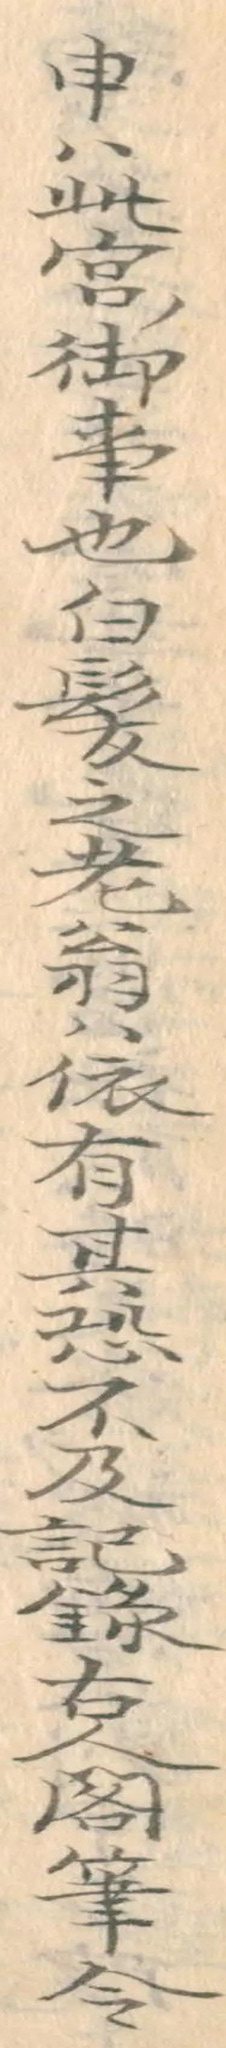申ハ此宮ノ御事也白髪之老翁ハ依有其恐不及記録古人閣筆令
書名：賀茂社記録. 第24冊
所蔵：国立国会図書館 National Diet Library, JAPAN
